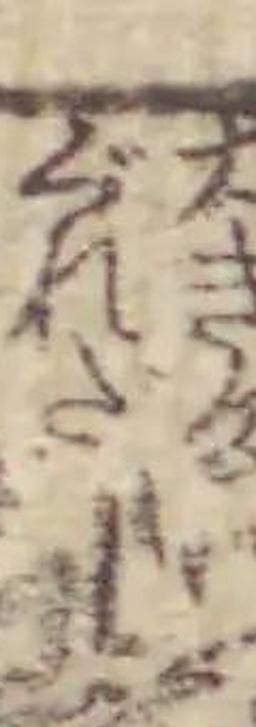ぐれだ
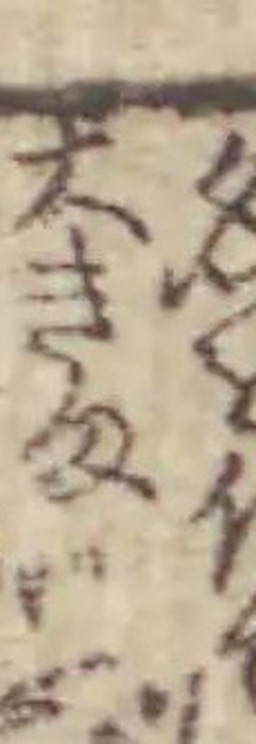大きま
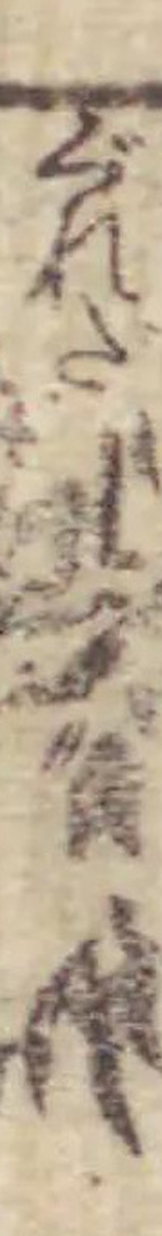ぐれだ
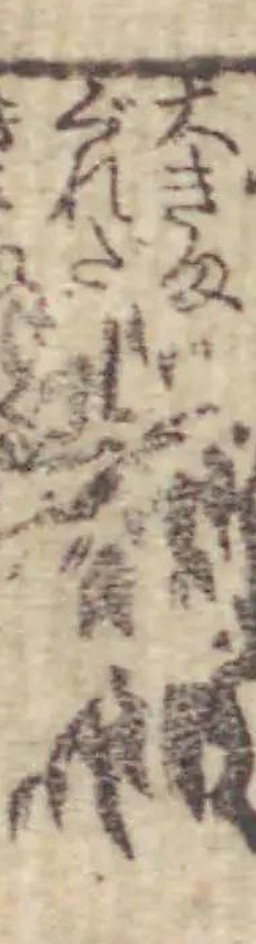ぐれだ
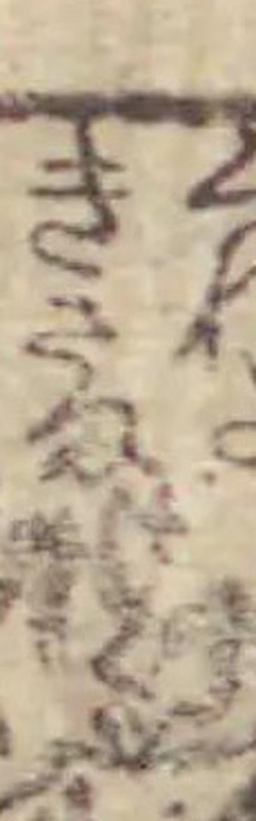きさまの
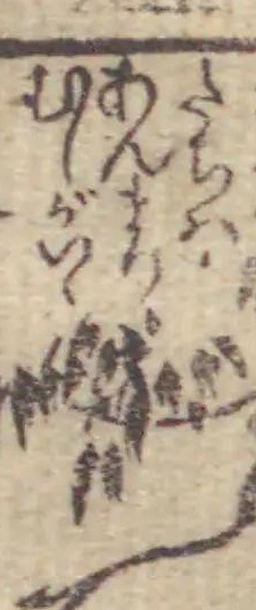むしがいゝ
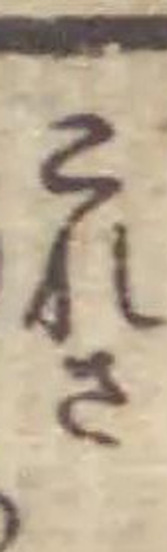これさ
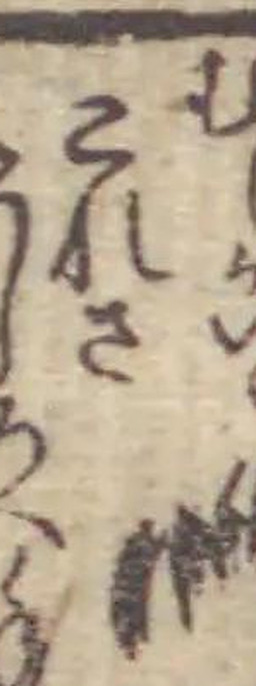これさ
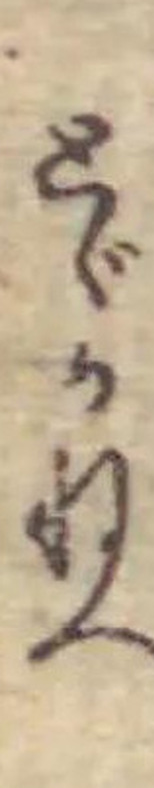とゞかねへ

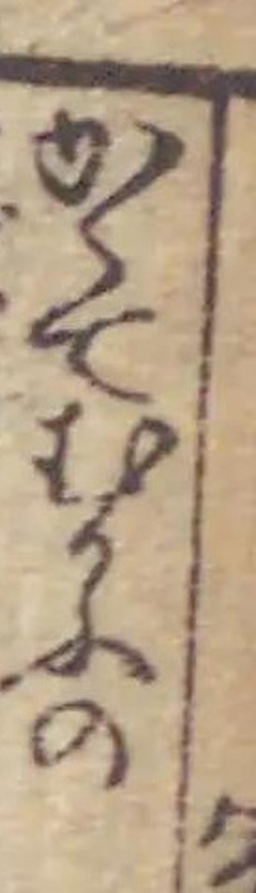かくてむかふの
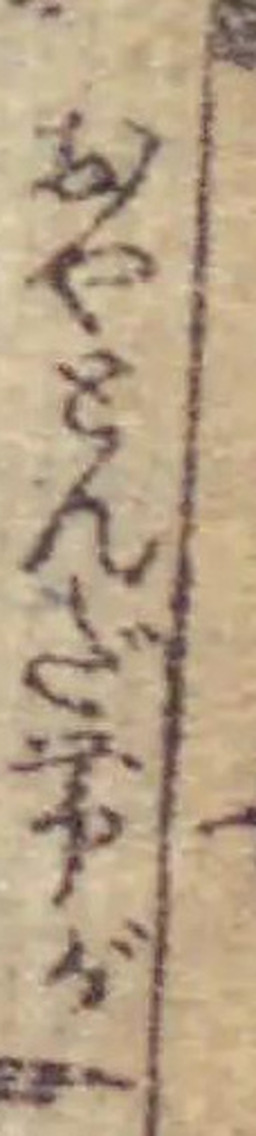おやとんだ帯が
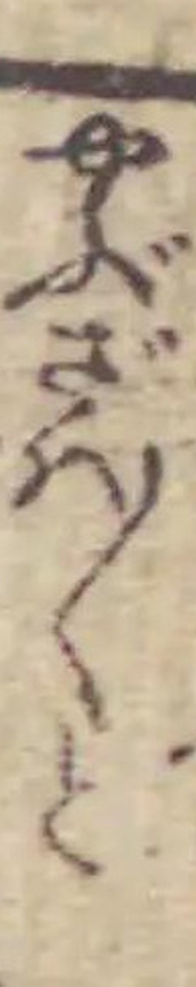やぶざは〳〵と
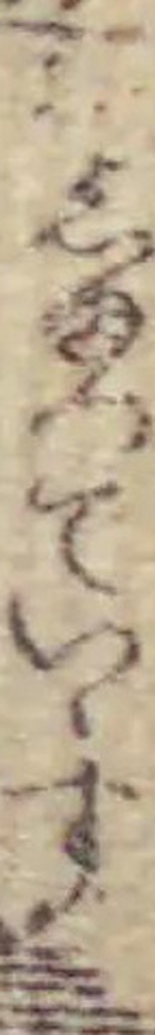しまつていゝす
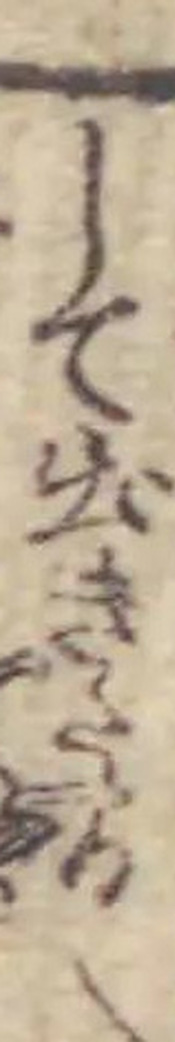して出きたる
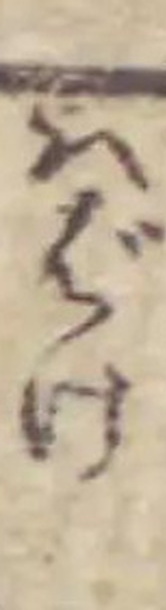はばけ
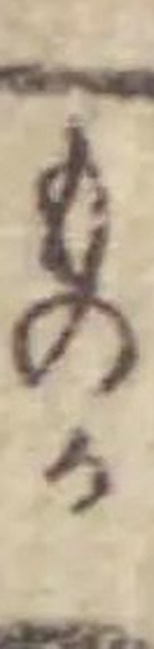ものか
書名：亀山人家妖 3巻
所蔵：国立国会図書館 National Diet Library, JAPAN
